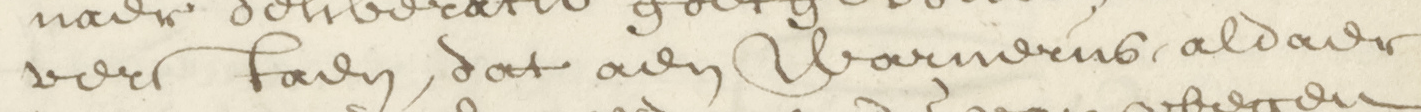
verstaen, dat aen Warnerus, aldaer
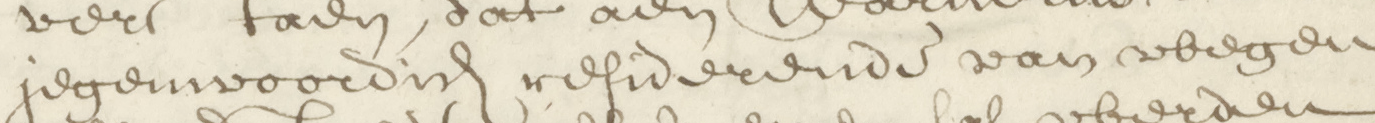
jegenwoordich residerende van wegen
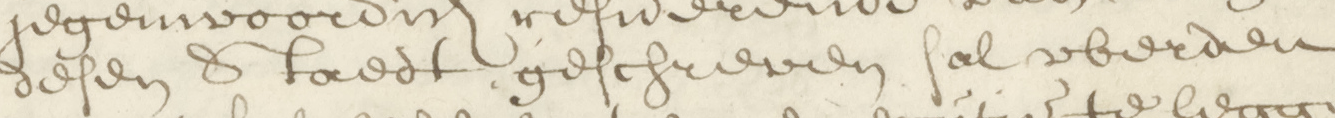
desen Staedt geschreven sal werden,
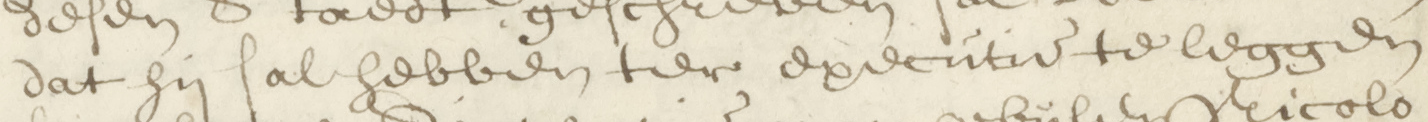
dat hij sal hebben ter executie te leggen
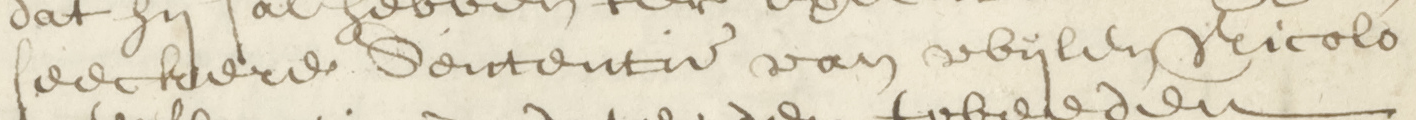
seeckere Sententie van wijlen Nicolo
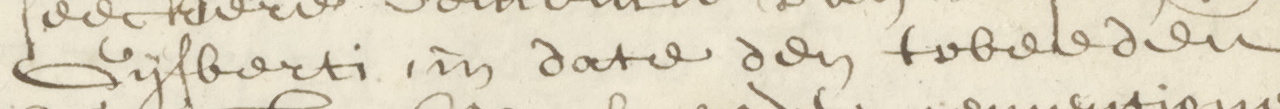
Gijsberti, in date den tweeden
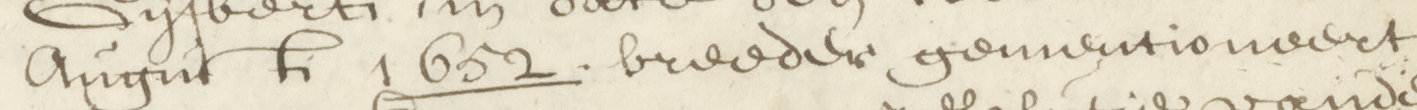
Augusti 1652, breeder gementioneert
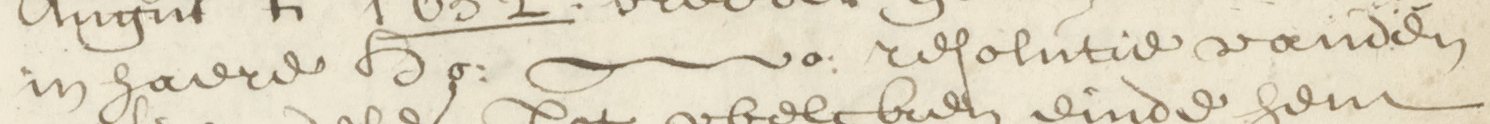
in haere Ho:Mo: resolutie vanden
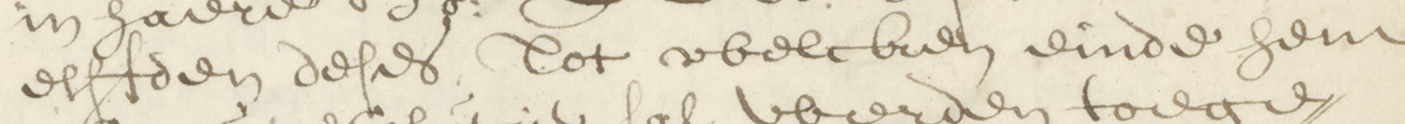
elffden deses, Tot welcken einde hem
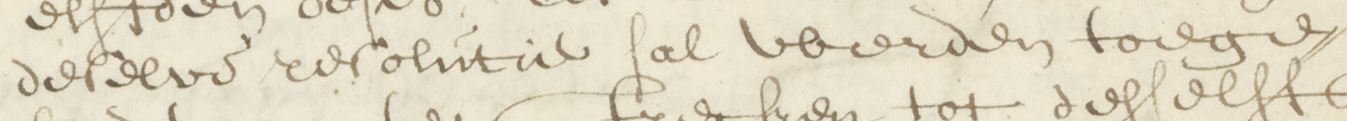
deselve resolutie sal werden toege„
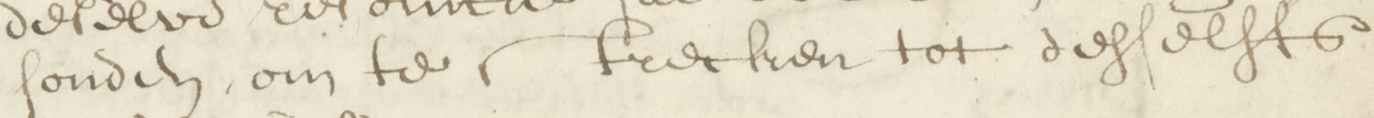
sonden, om te strecken tot desselffs
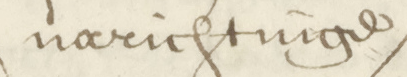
narichtinge.
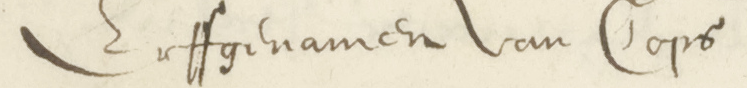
Erffgenamen van Cops
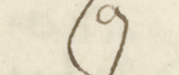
ca
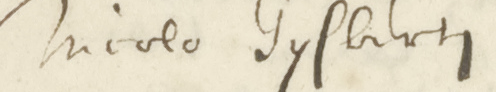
Nicolo Gysberti
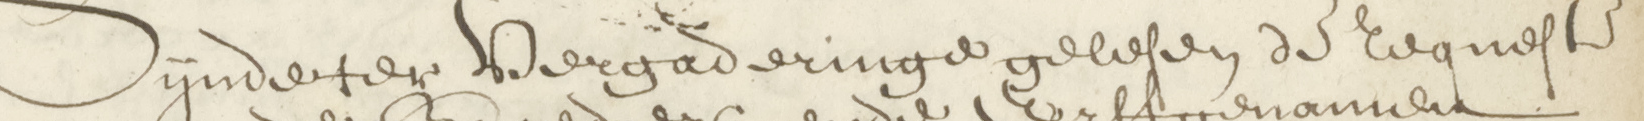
Sijnde ter Vergaderinge gelesen de Requeste
